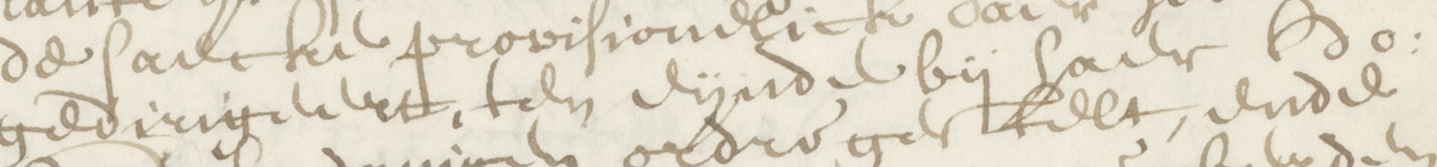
gedirigeert, ten eijnde bij haer Ho:
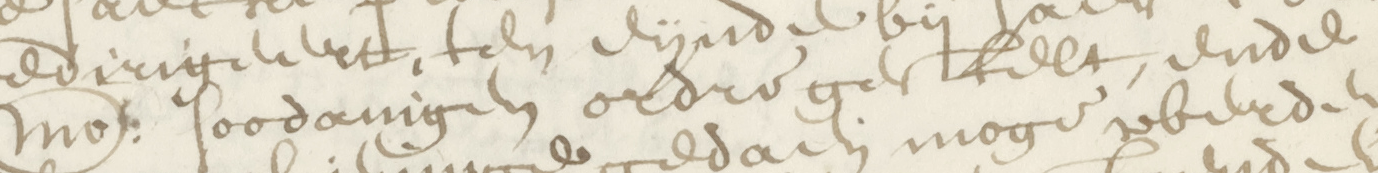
Mo: soodanigen ordre gestelt, ende
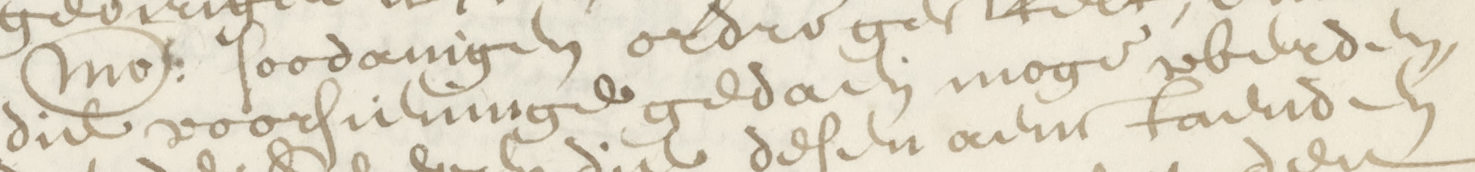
die voorsieninge gedaen moge werden,
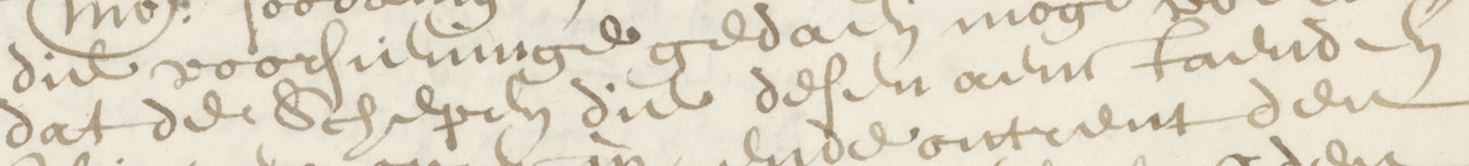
dat de Schepen die desen aenstaenden
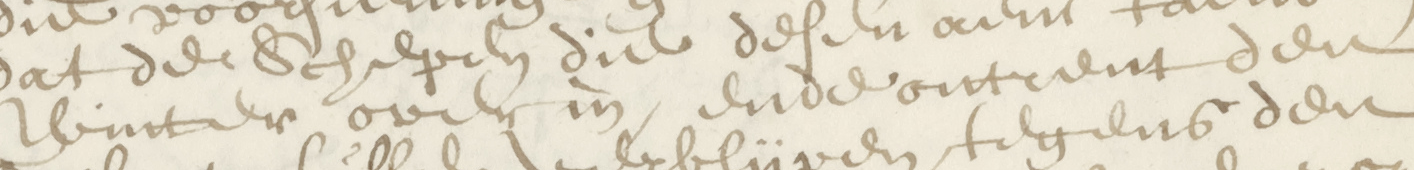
winter over in, ende ontrent den
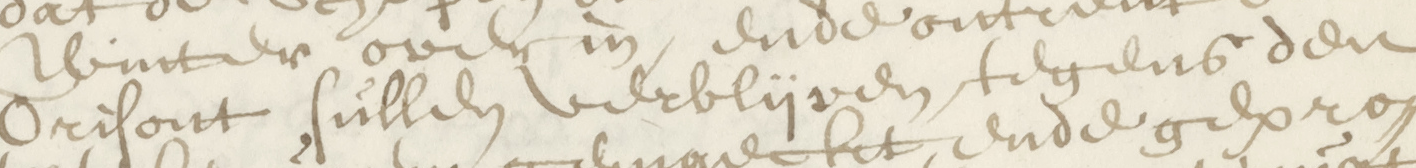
Orisont sullen verblijven, tegens den
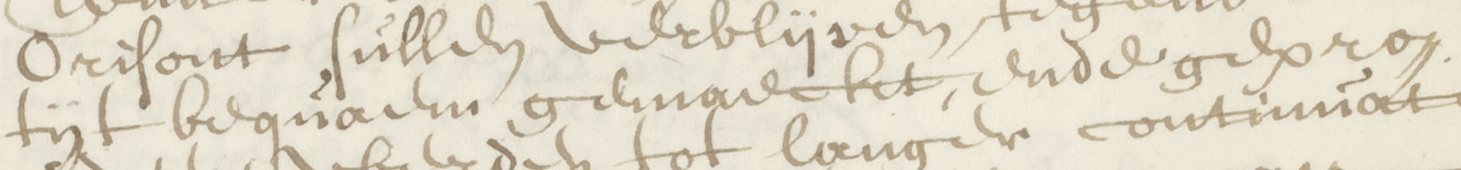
tijt bequaem gemaeckt, ende gepro,,
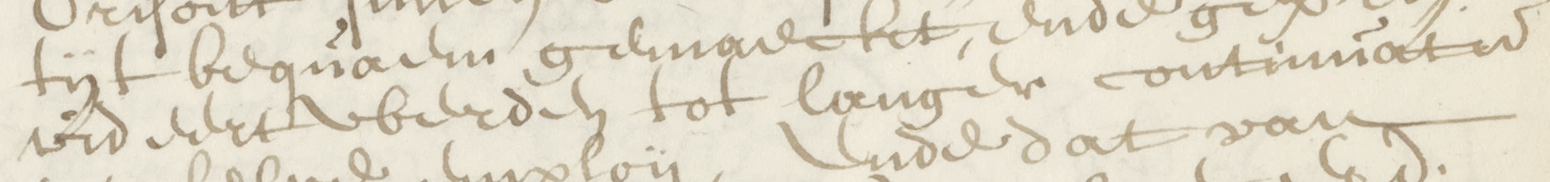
videert werden tot langer continuatie
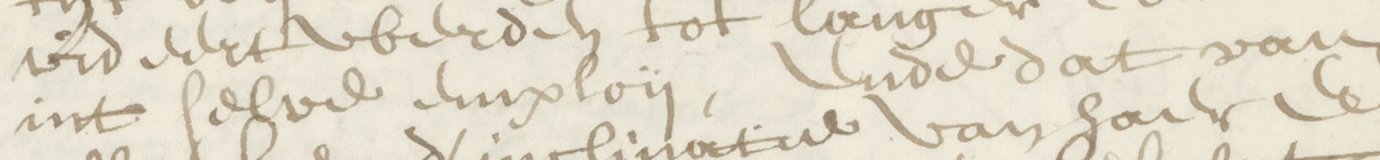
int selve emploij. Ende dat van
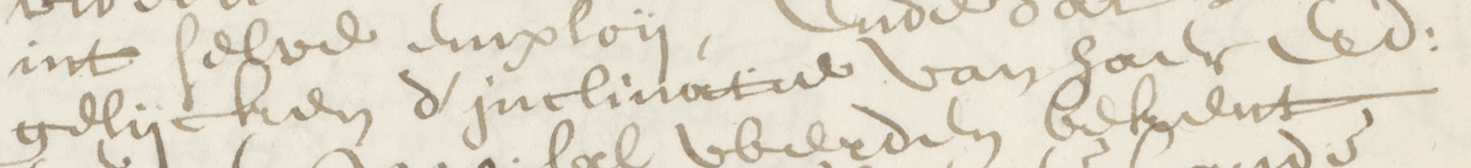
gelijcken d'inclinatie van haer Ed:
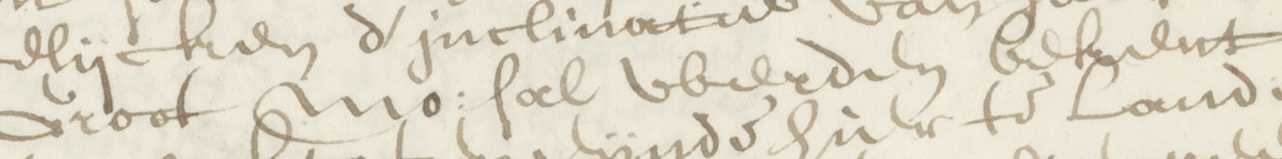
Groot Mo: sal werden bekent
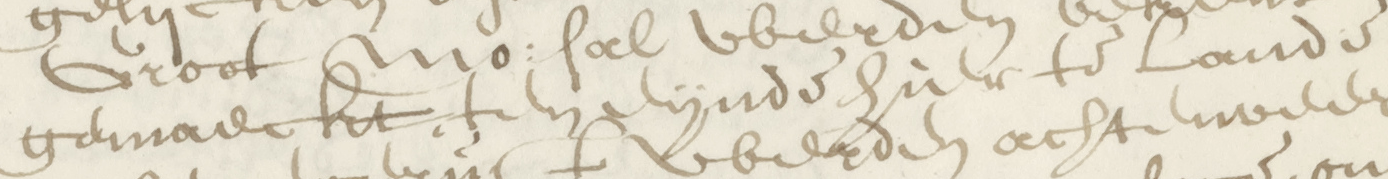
gemaeckt, ten eijnde hier te Lande
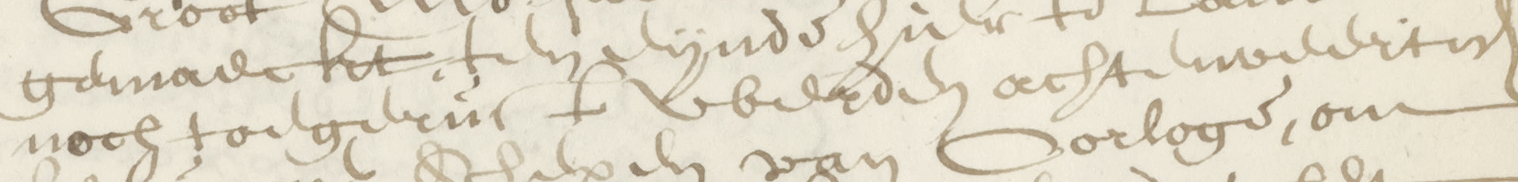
noch toegerust werden achtenveertich
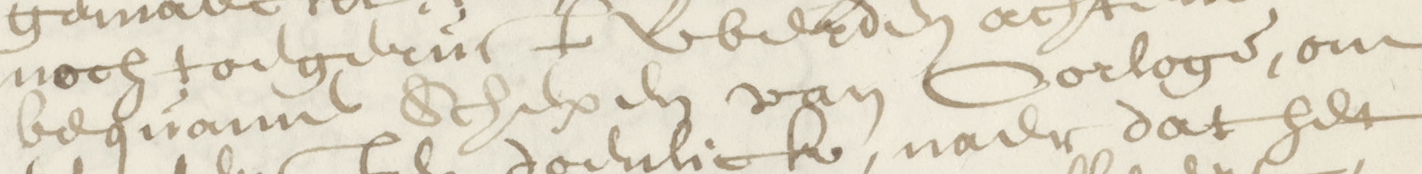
bequame Schepen van Oorloge, om
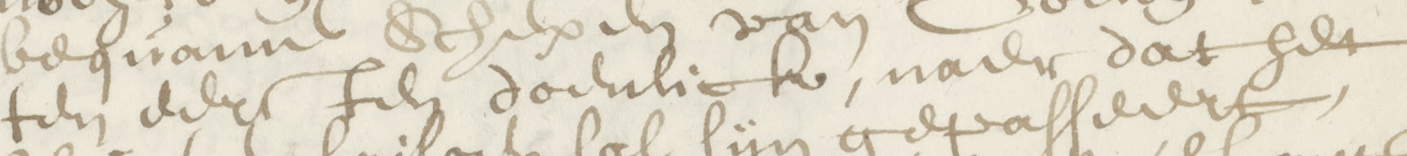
ten eersten doenlick, naer dat het
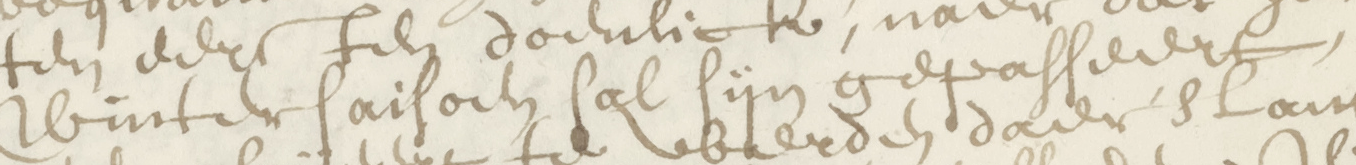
Wintersaisoen sal sijn gepasseert,
